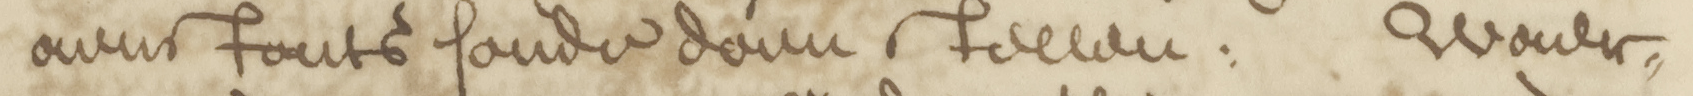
aenstonts soude doen stellen. Waer,,
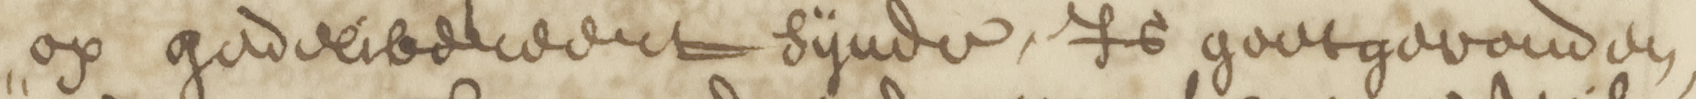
„op gedelibereert sijnde, Is goetgevonden,
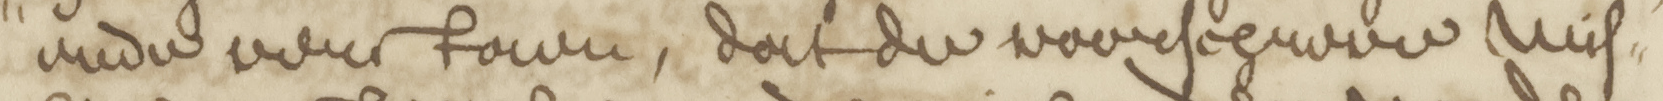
ende verstaen, dat de voorschreve Mis,,
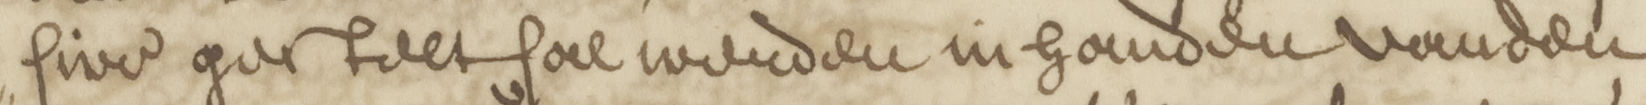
„sive gestelt sal werden in handen vanden
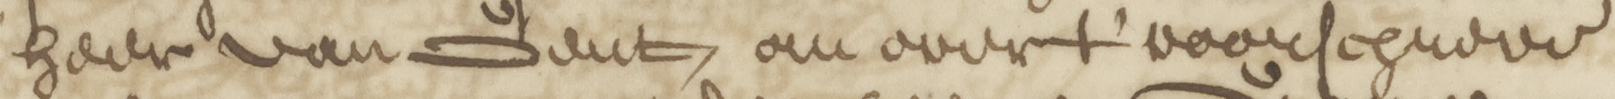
heer van Gent, om overt' voorschreve
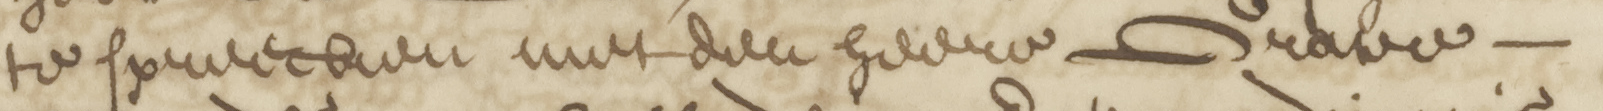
te spreecken met den heere Grave —
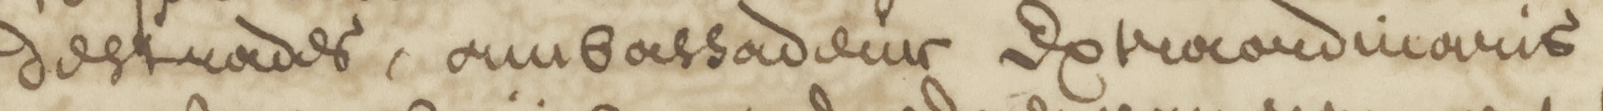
Destrades, ambassadeur Extraordinaris
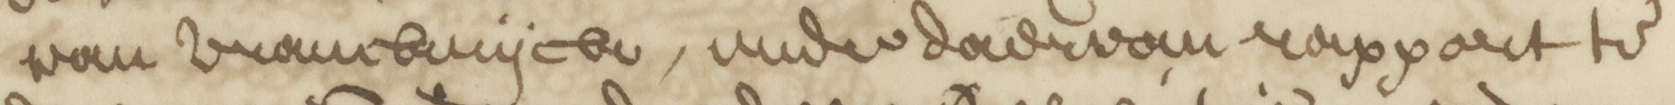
van Vranckrijck, ende daervan rapport te
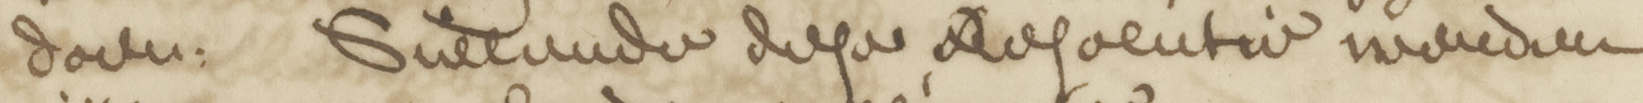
doen: Sullende dese Resolutie werden
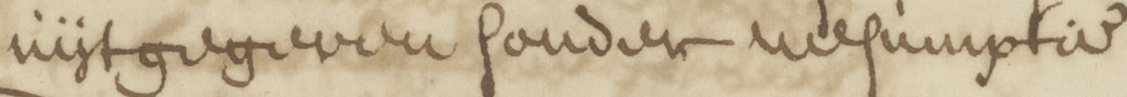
uijtgegeven sonder resumptie
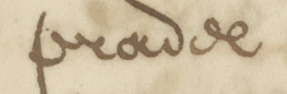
pradel
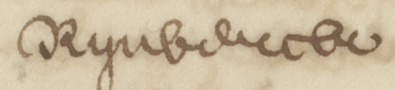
Rijnberck
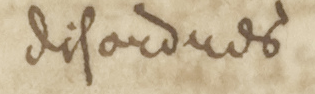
disordres
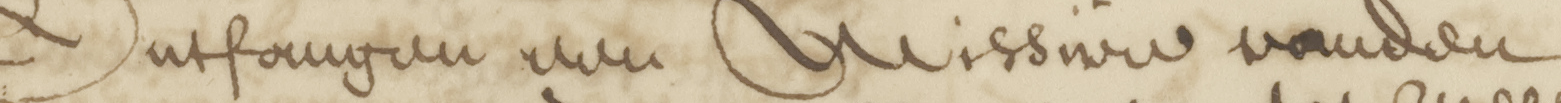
Ontfangen een Missive vanden
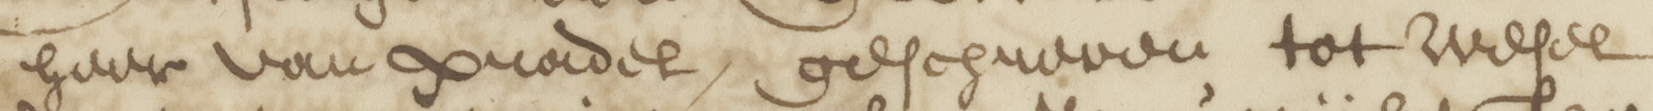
heer van Pradel, geschreven tot Wesel
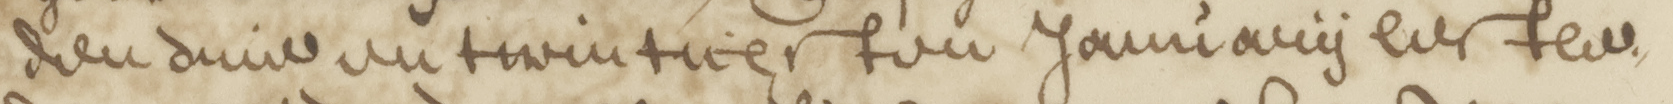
den drie en twintichsten Januarij lestle,,
